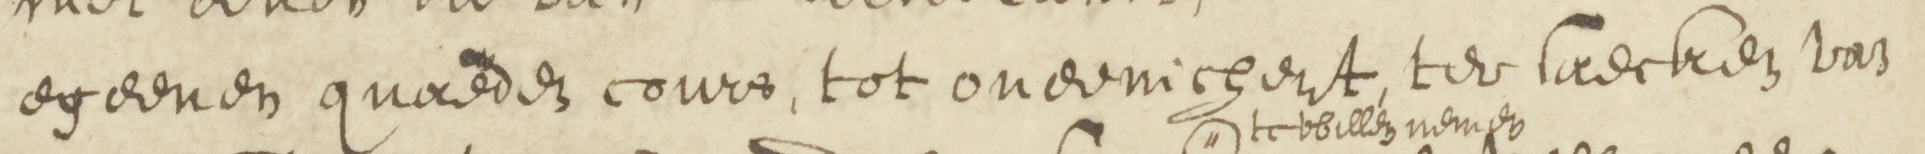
egeenen quaden cours, tot oneenicheyt ter saecken van
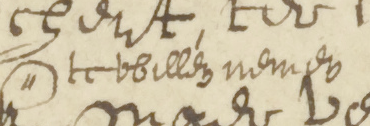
,,te willen nemen
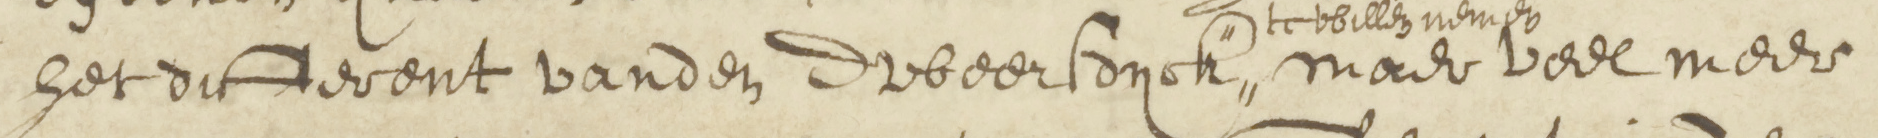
het different vanden dweersdyck,, maer veel meer
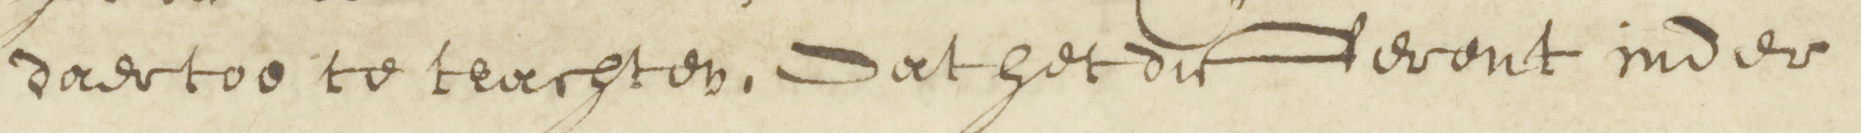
daertoe te trachten, dat het different inder
